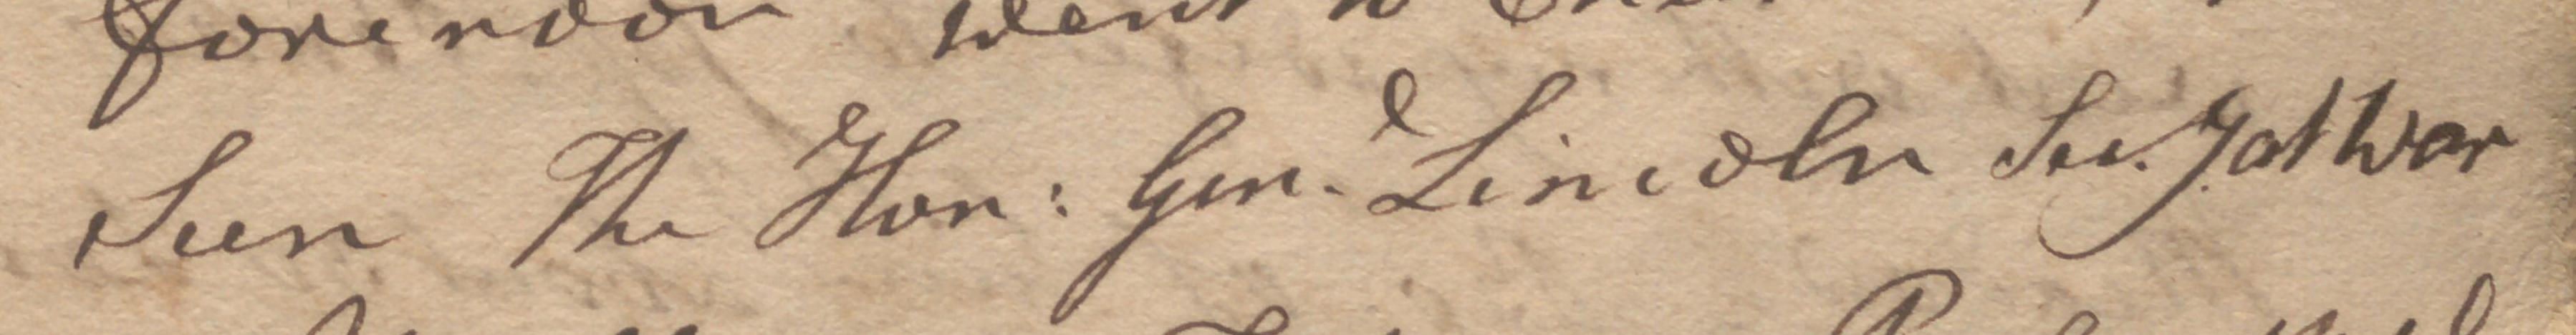seen The Hon: Gen^l. Lincoln sec^y. at war
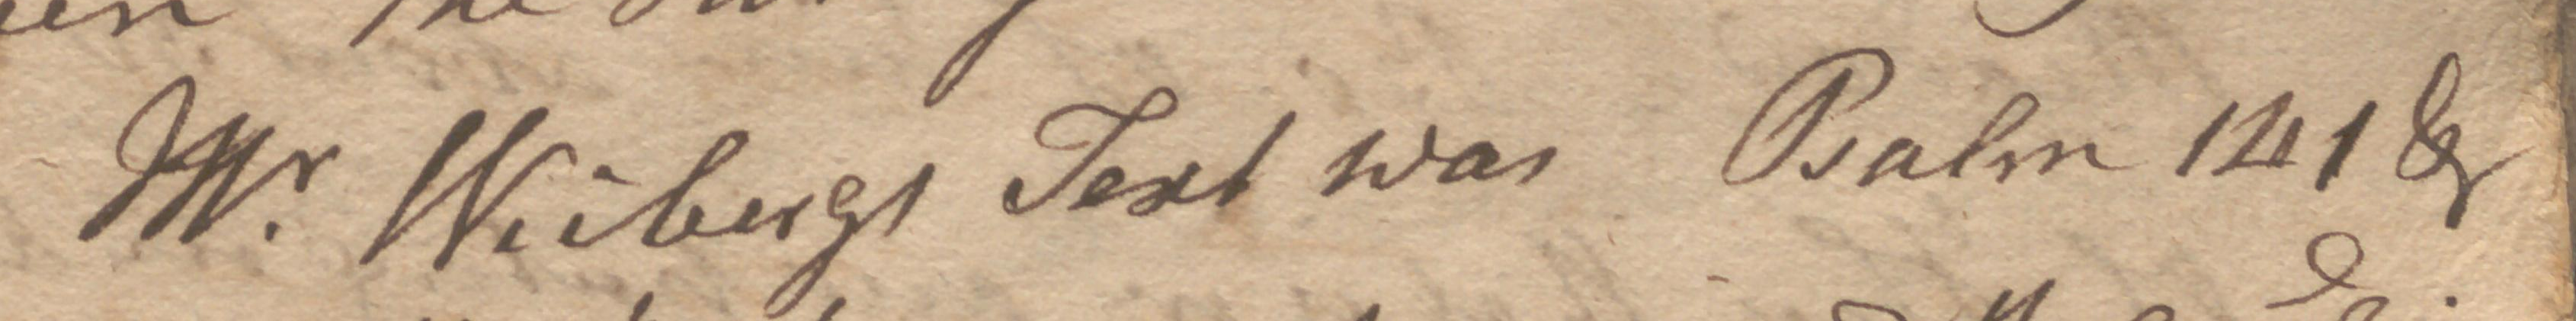M^r. Weibergs Text was Psalm 141 &
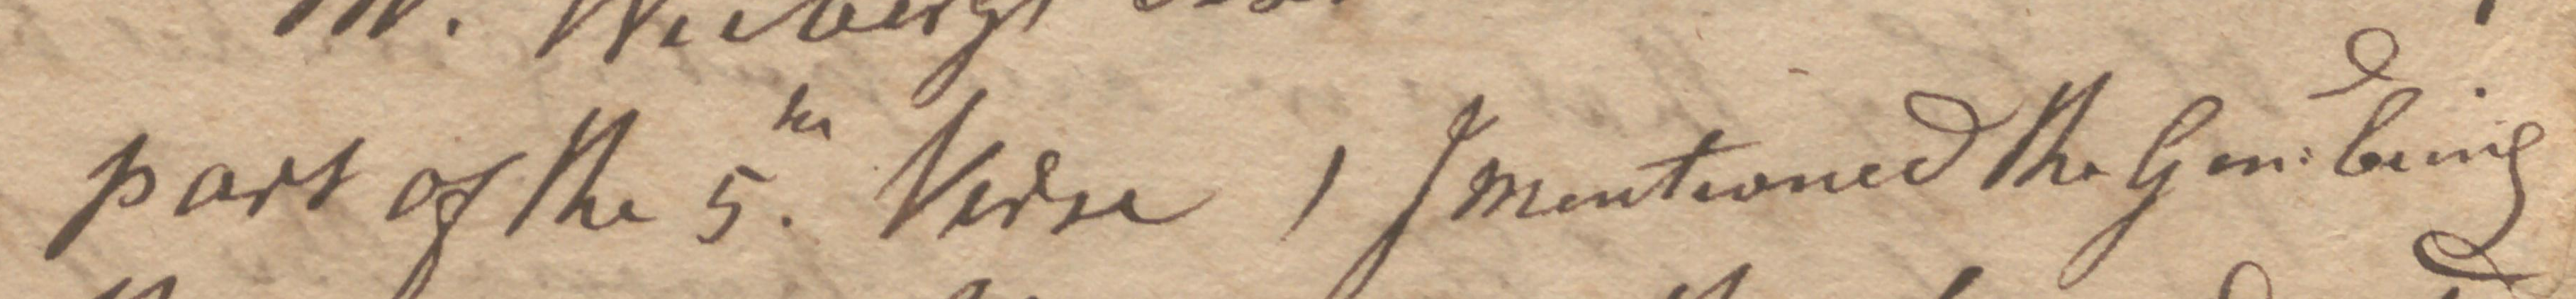part of the 5^th. Verse I mentioned the Gen^l. being
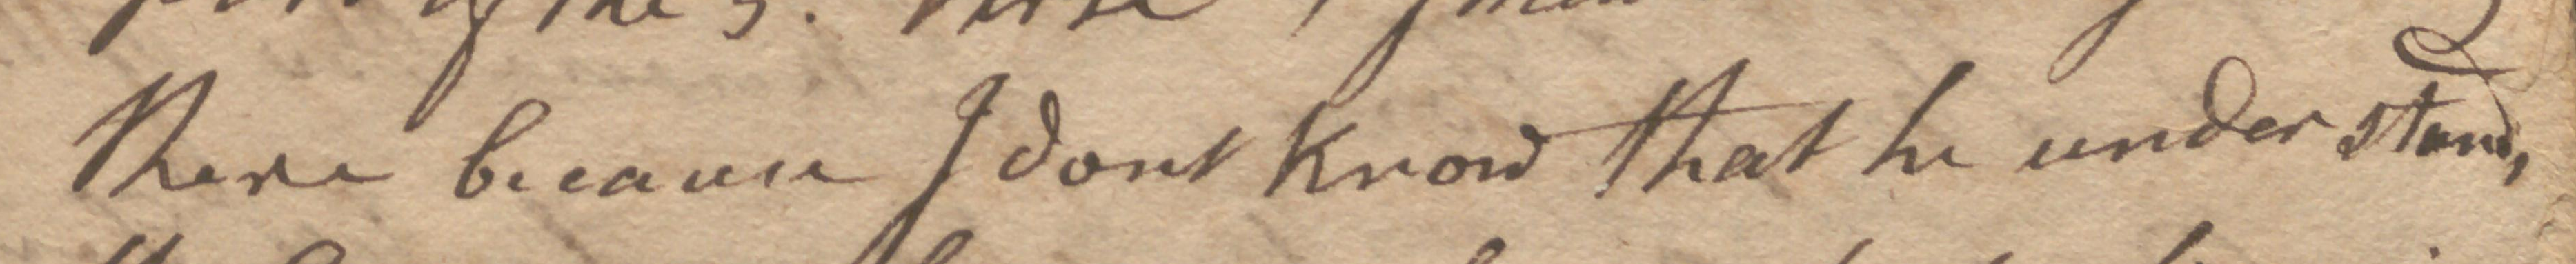there because I dont know that he understand
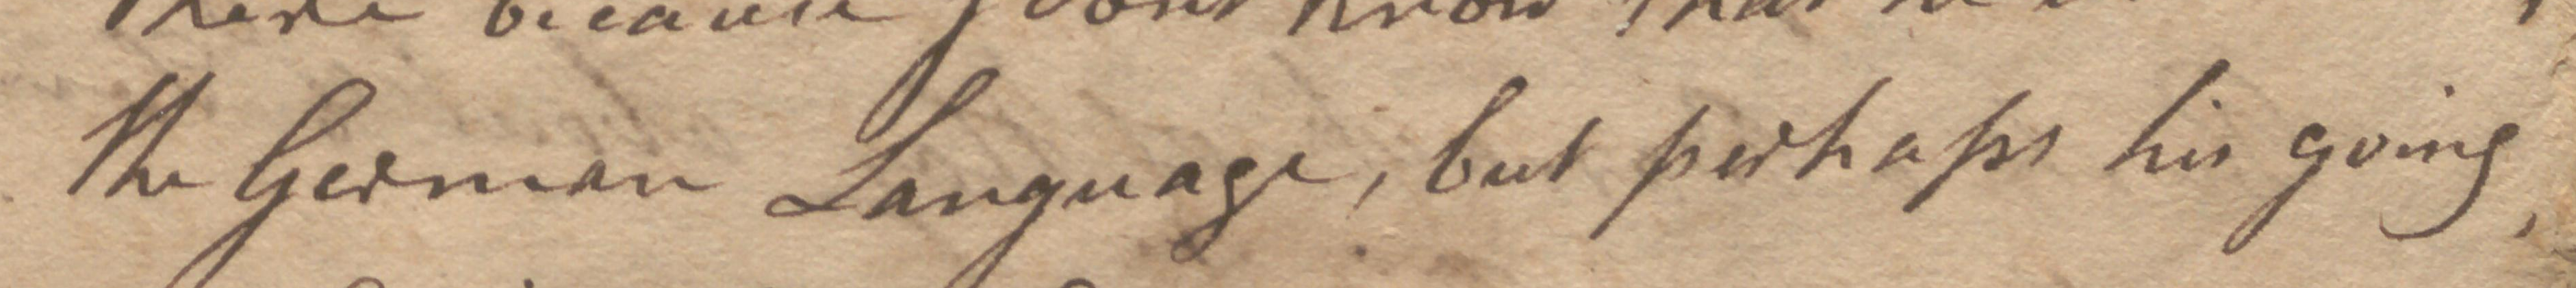the German Language, but perhaps his going
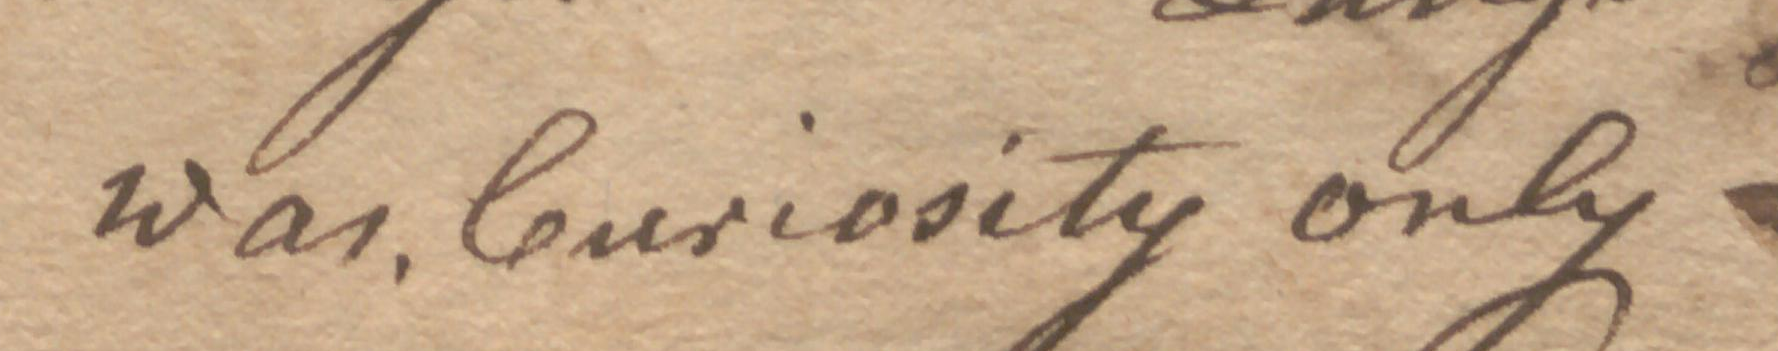was Curiosity only
